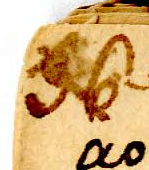36
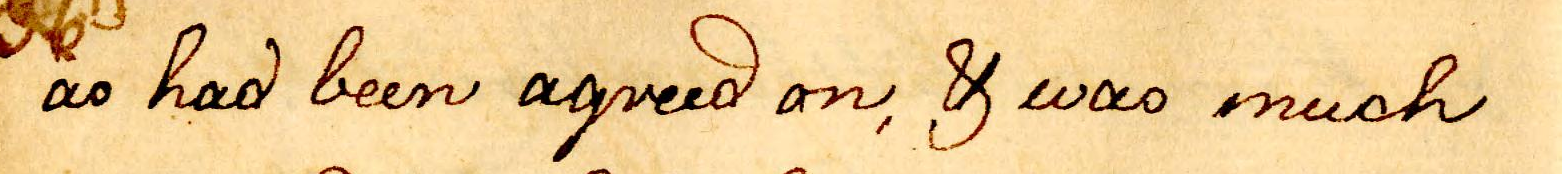as had been agreed on, & was much
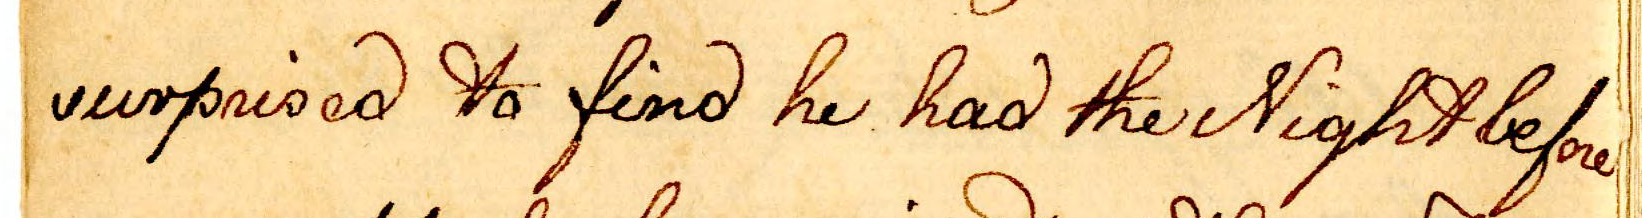surprised to find he had the Night before
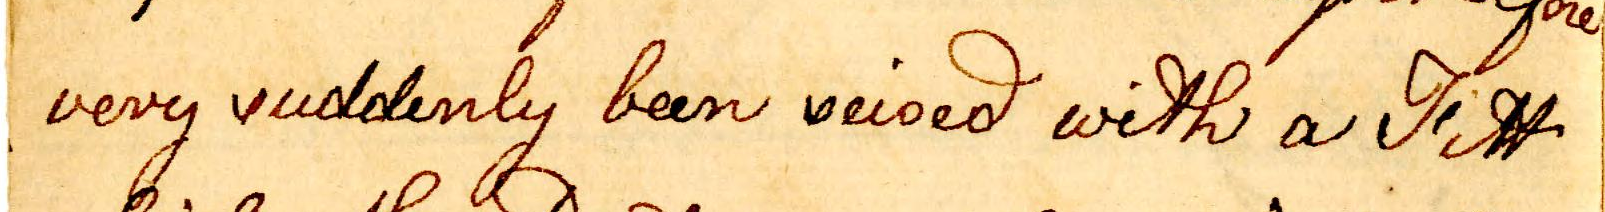very suddenly been raised with a Fitt
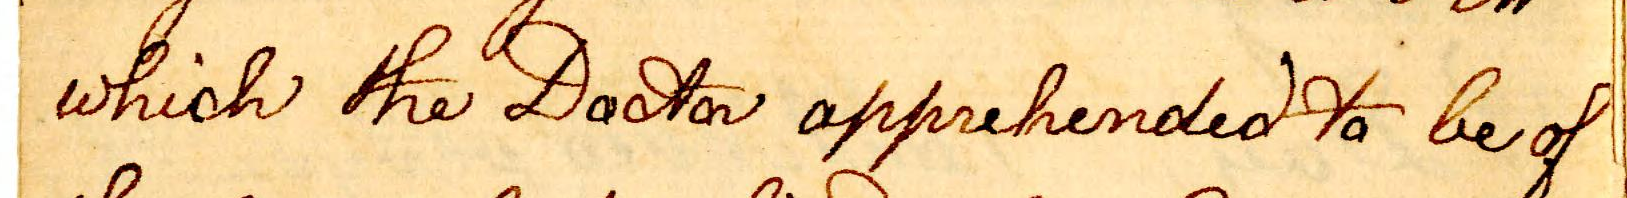which the Doctor apprehended to be of
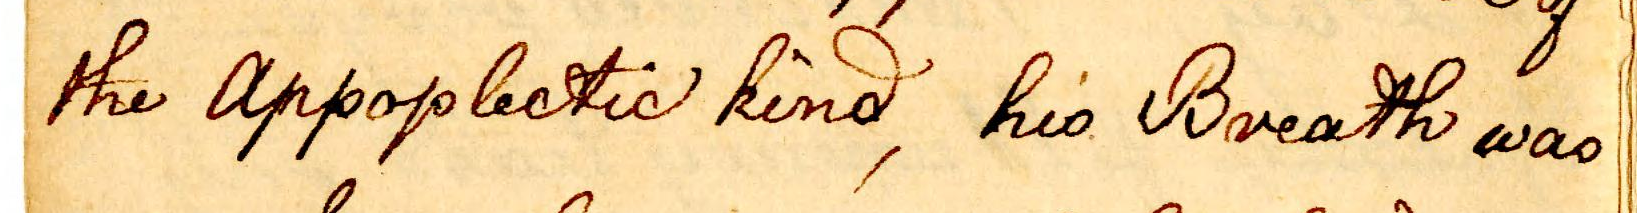the Appoplectic kind, his Breath was
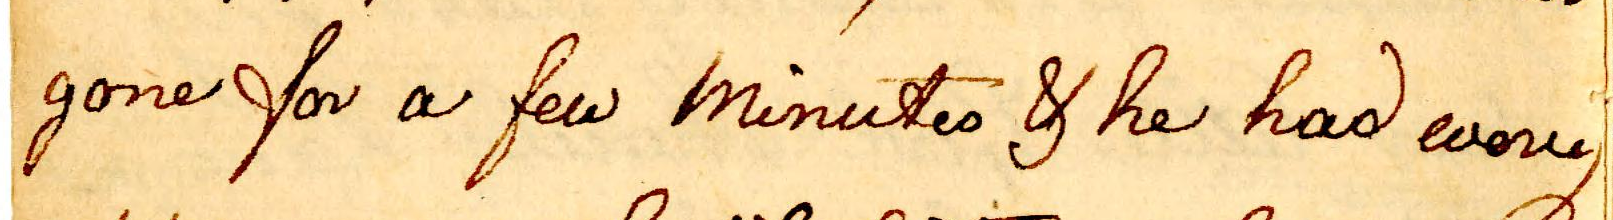gone for a few minutes & he had every
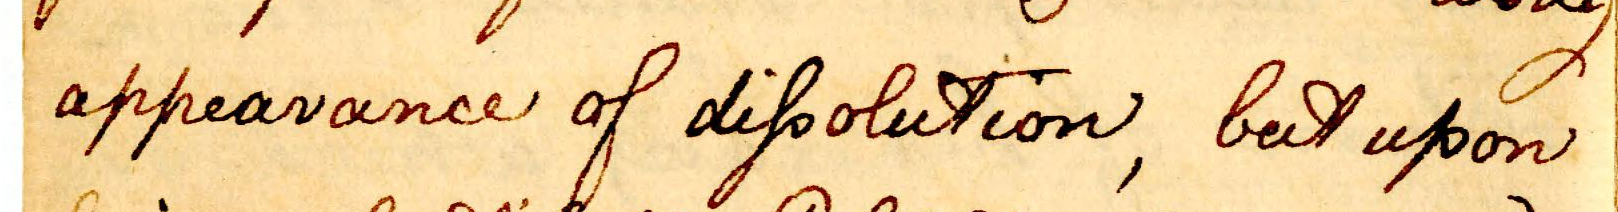appearance of dissolution, but upon
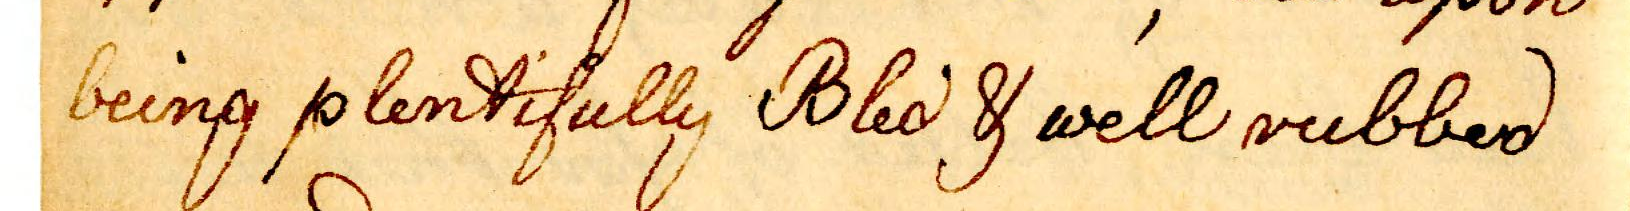being plentifully Bled & well rubbed
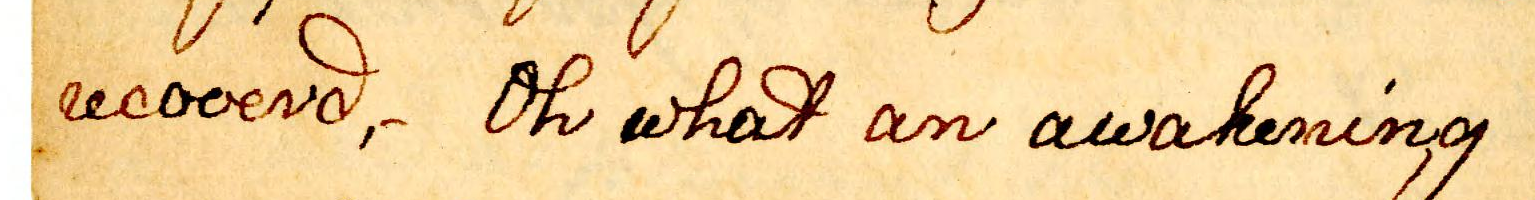recoverd, Oh what an awakening
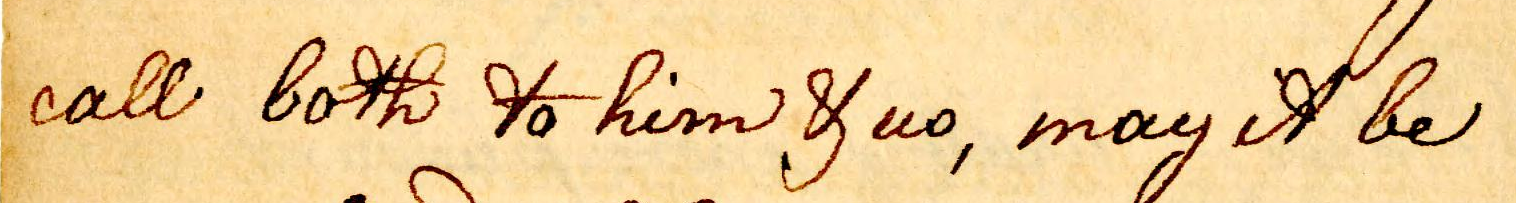call both to him & us, may it be
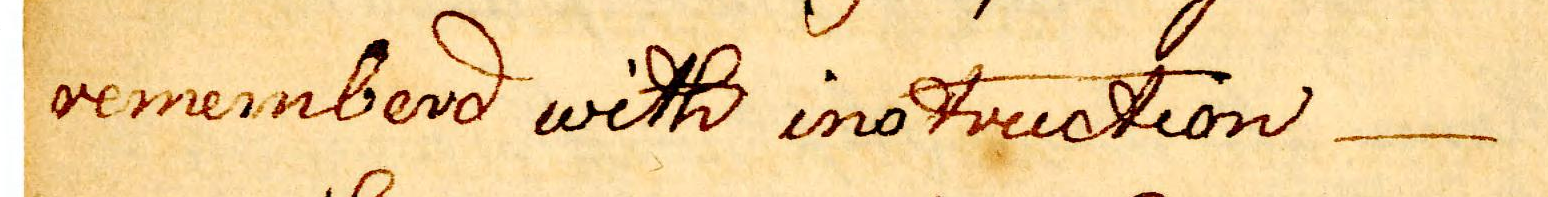rememberd with instruction
